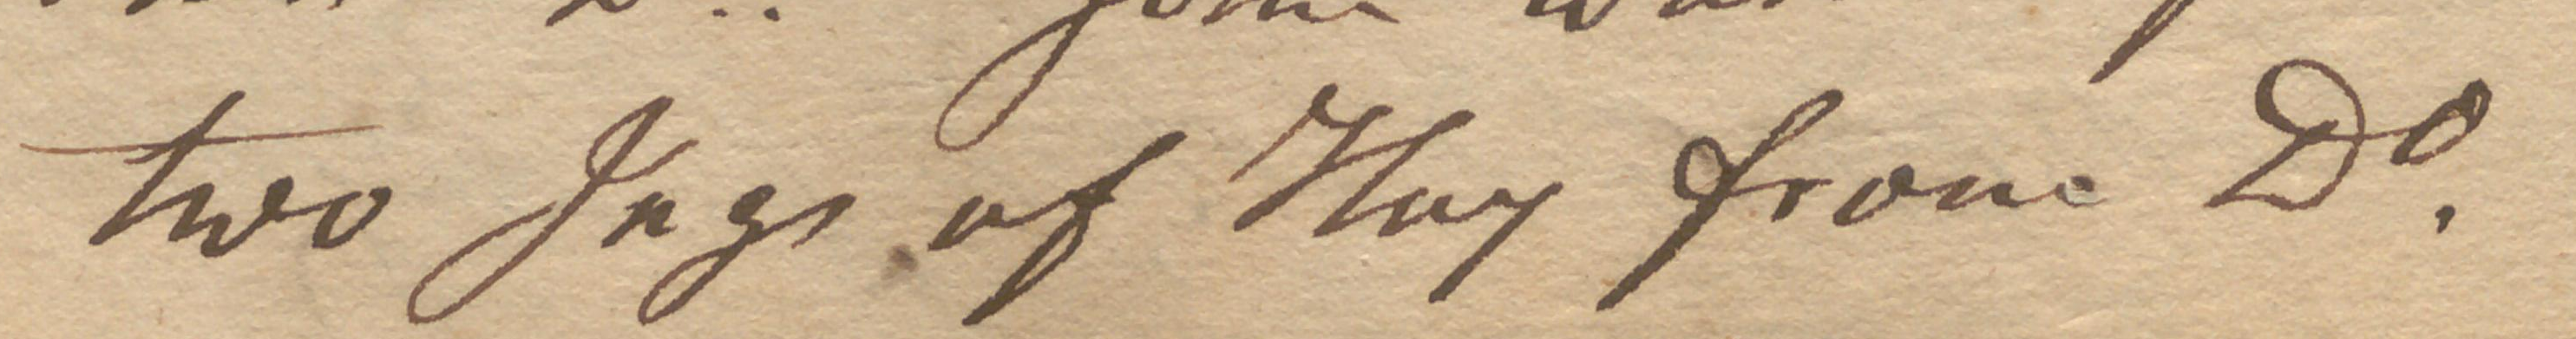two Jags of Hay from D^o.
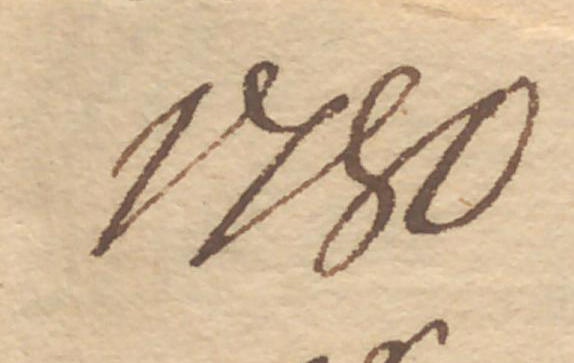1780
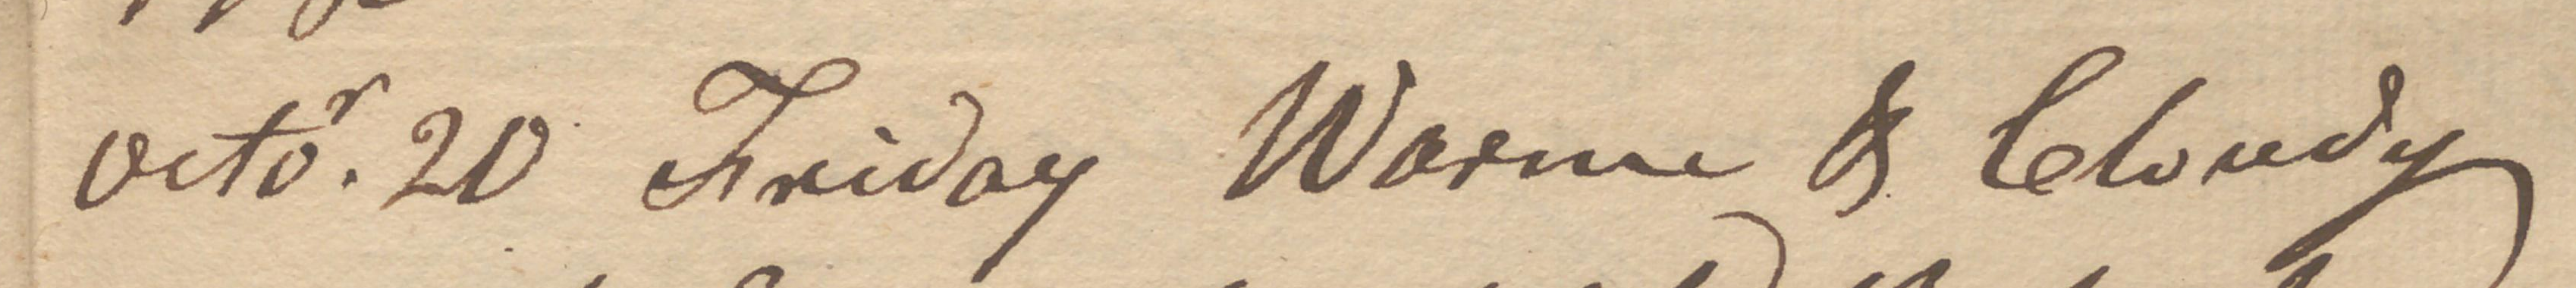Octo^r. 20 Friday Warme & Cloudy
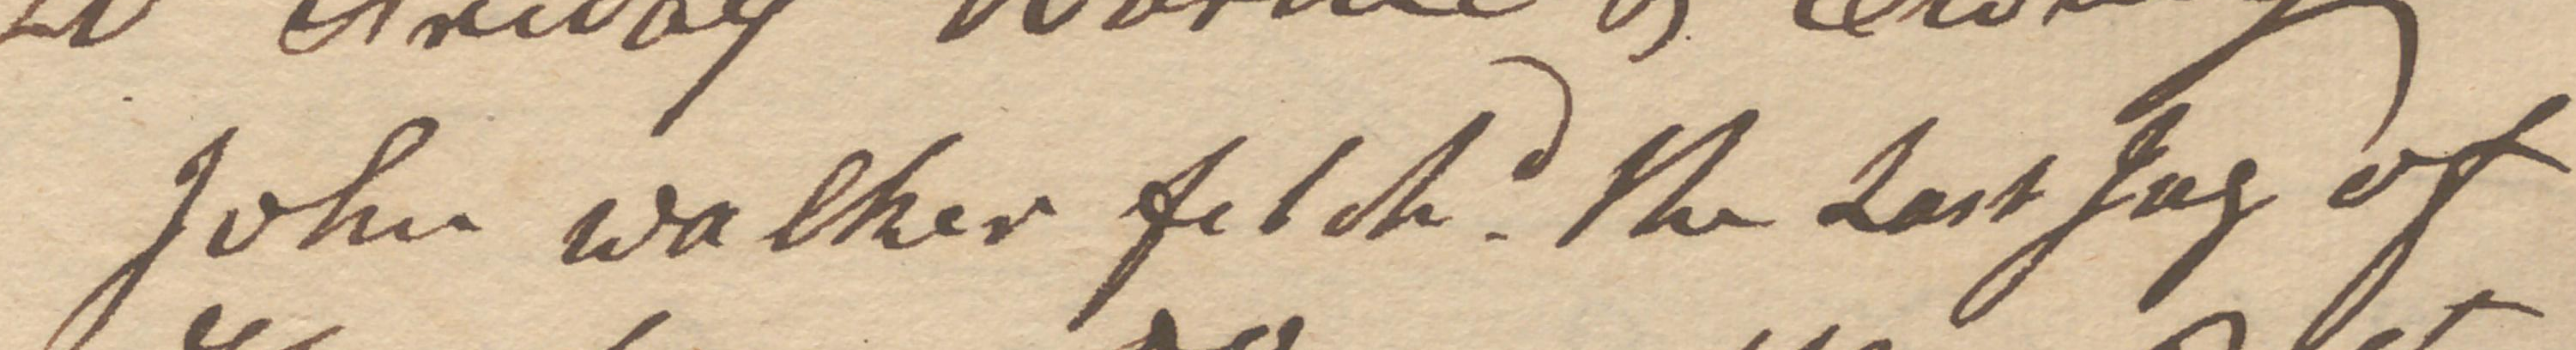John walker fetch^d. the Last Jag of
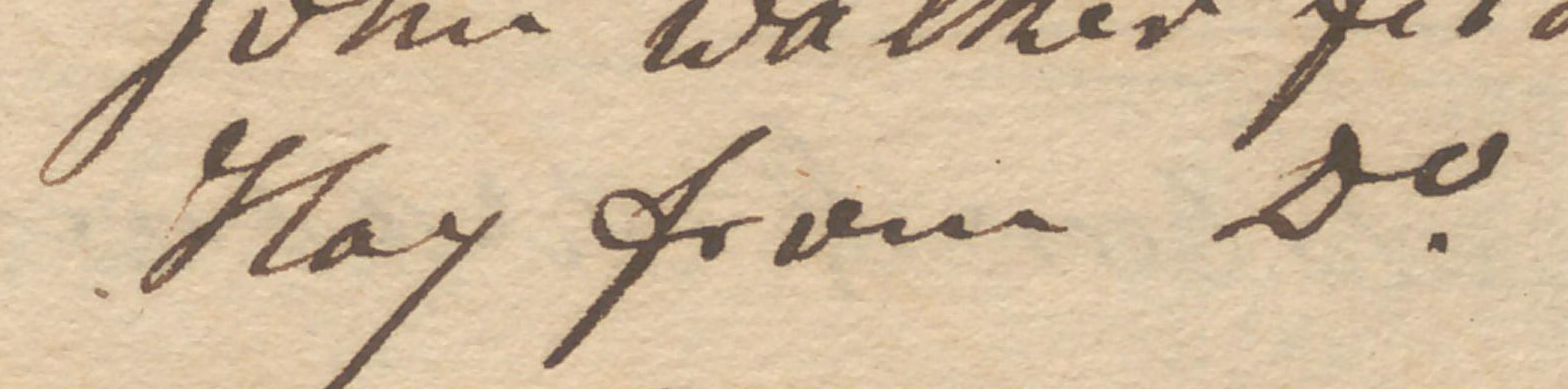Hay from D^o.
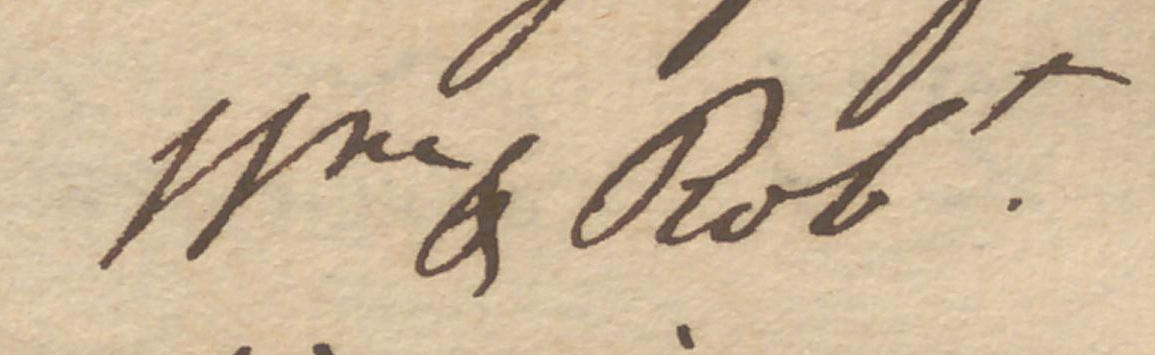W^m & Rob^t.
